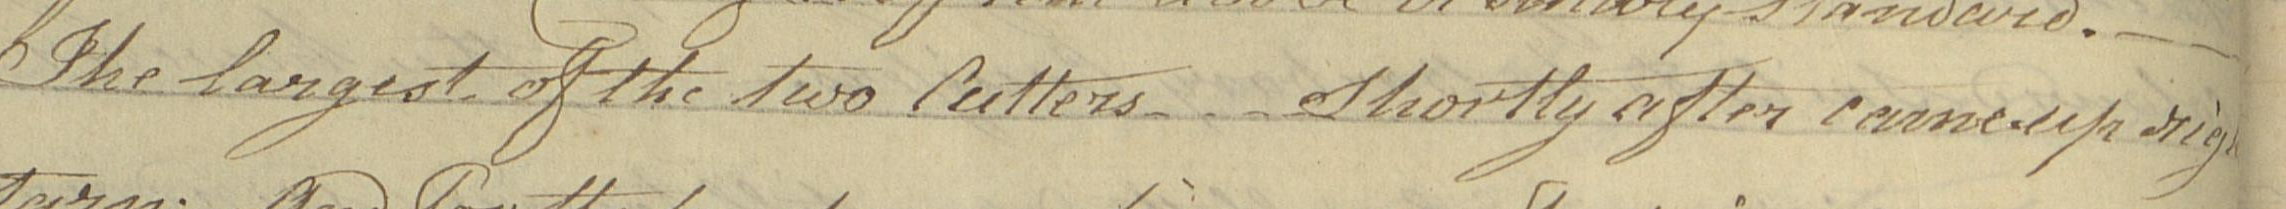The largest of the two Cutters Shortly after came up righ-
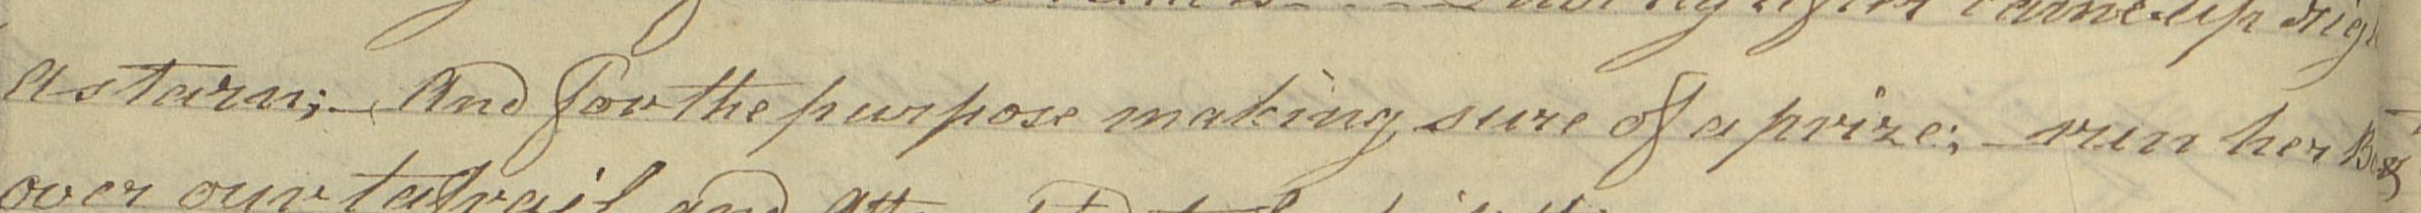astern; And for the purpose making sure of aprize; run her B-
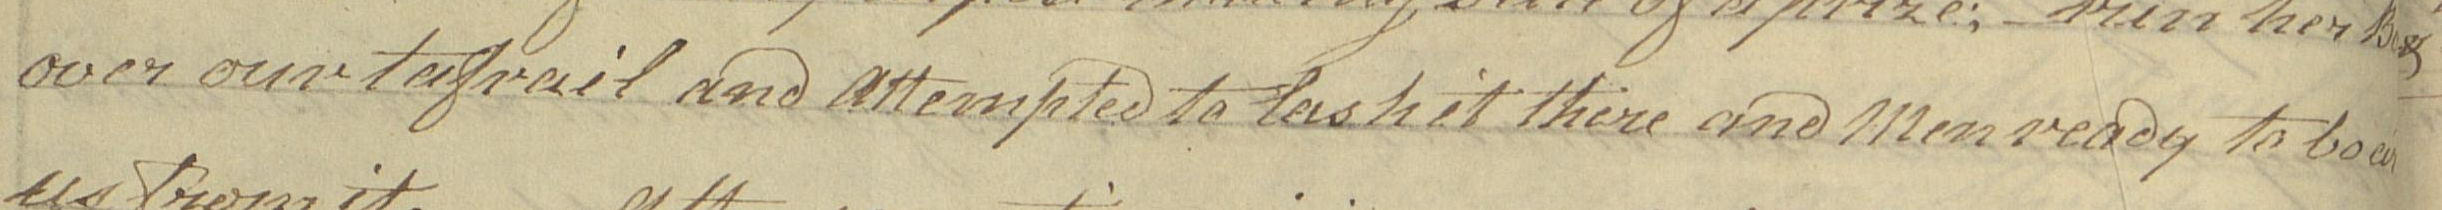over our tafrail and attempted to lash it there and Men ready to bo-
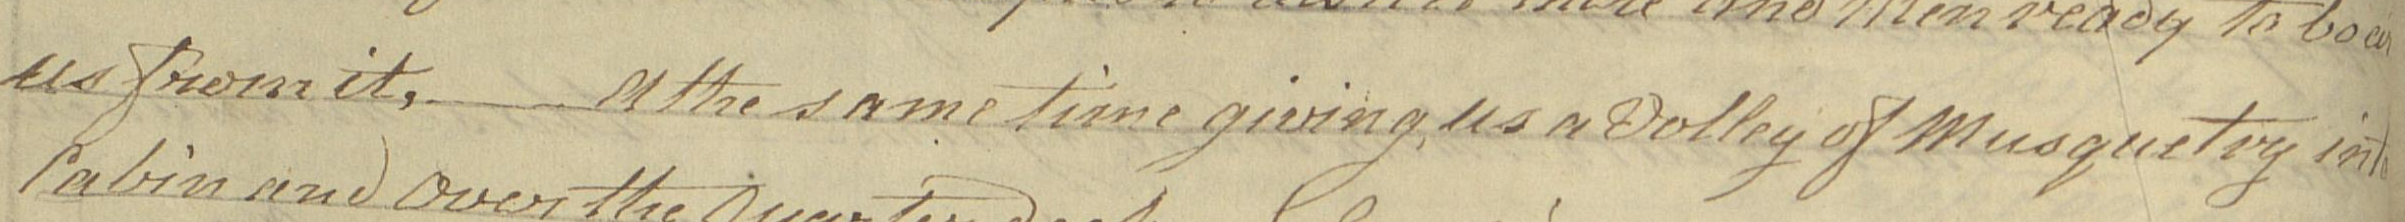us from it. A the same time giving us a Volley of Musquetry into
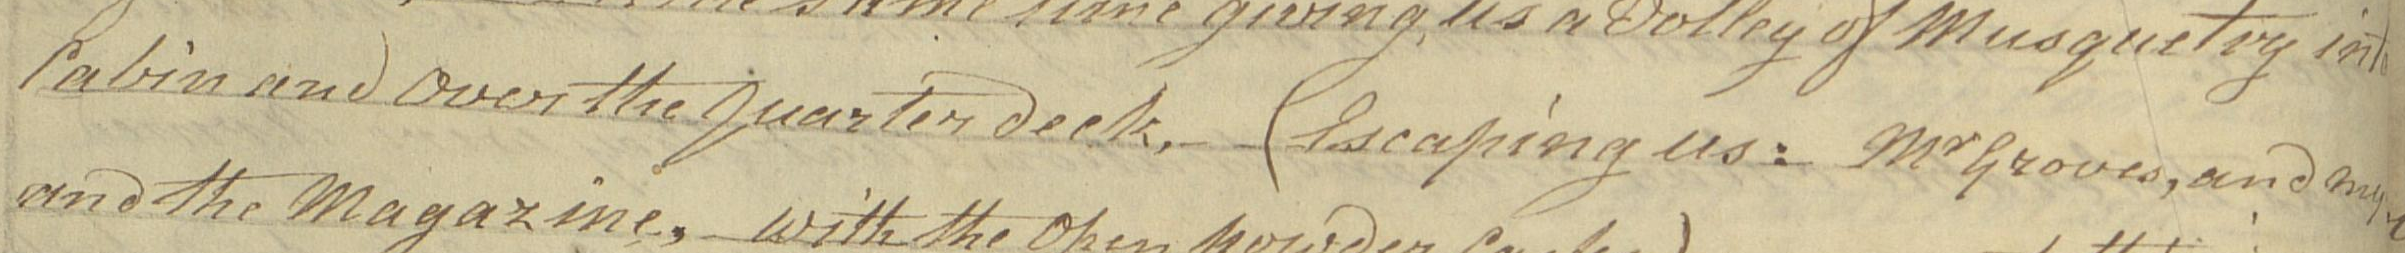Cabin and over the quarter deck (Escaping us: M^r. Groves, and my
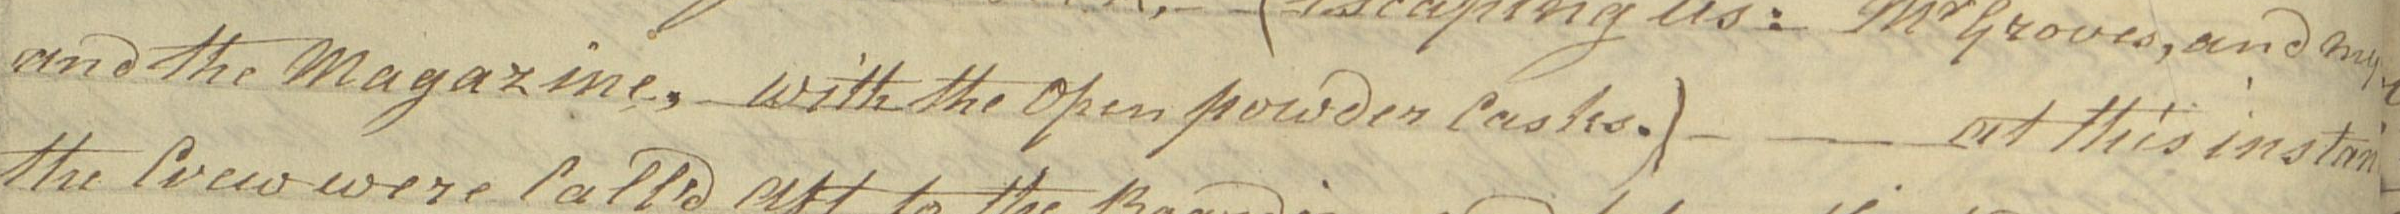and the Magazine, with the Open powder casks.) At this instan-
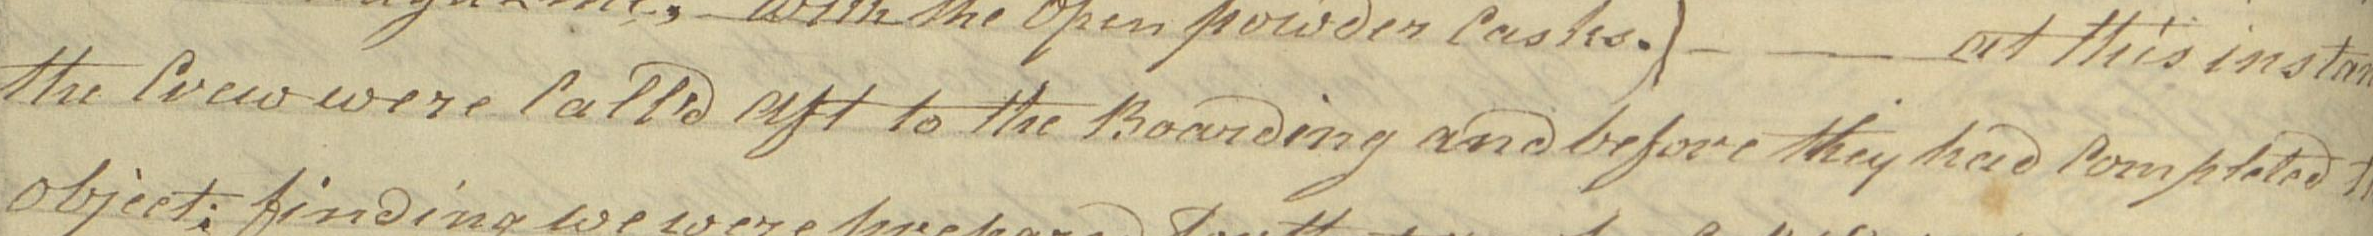the Crew were Call'd aft to the Boarding and before they had Completed
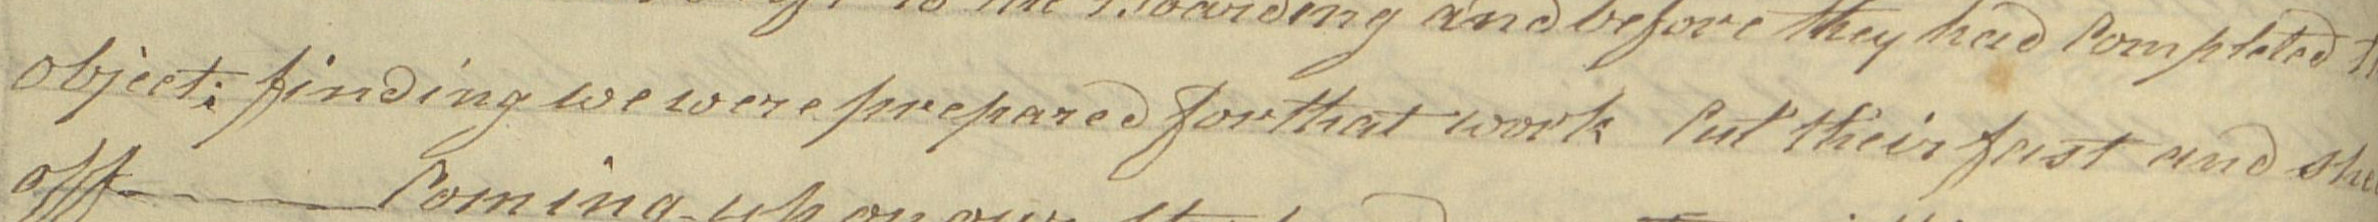object: finding we were prepared for that work but their fast and she-
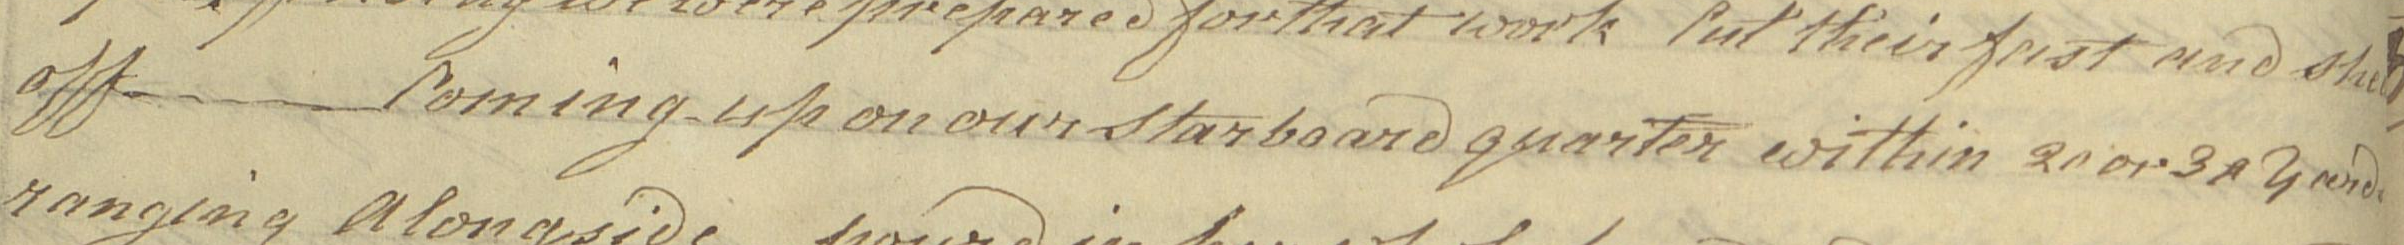off. Coming upon our starboard quarter within 2 or 3 yards
